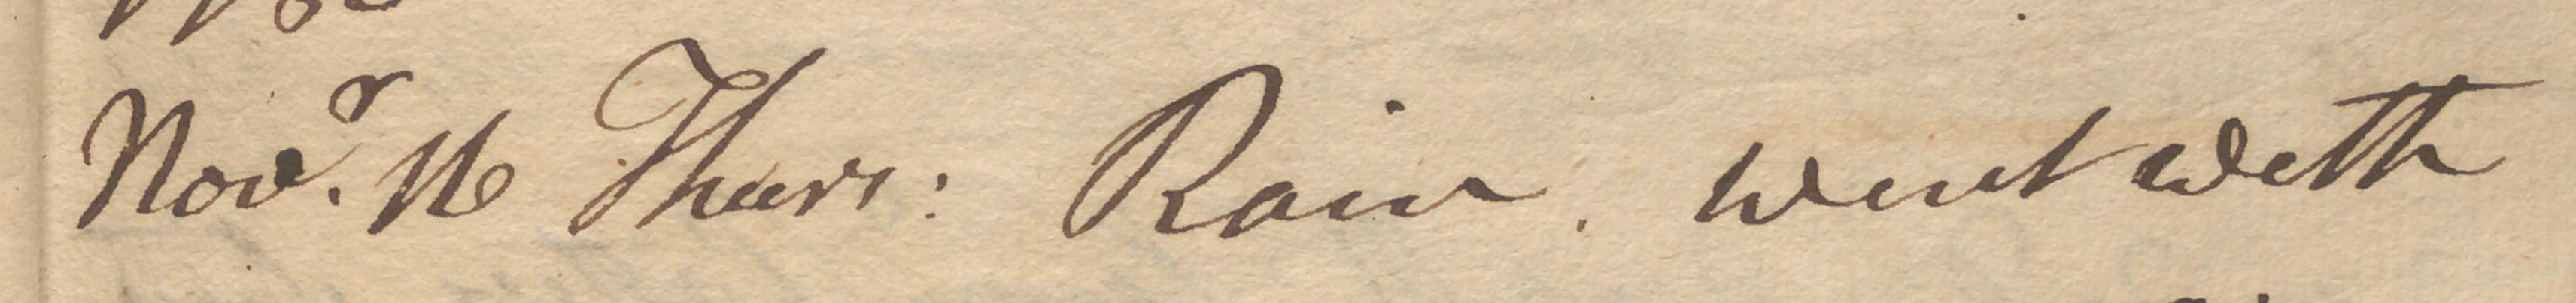Nov^r. 16 Thars. Rain went with
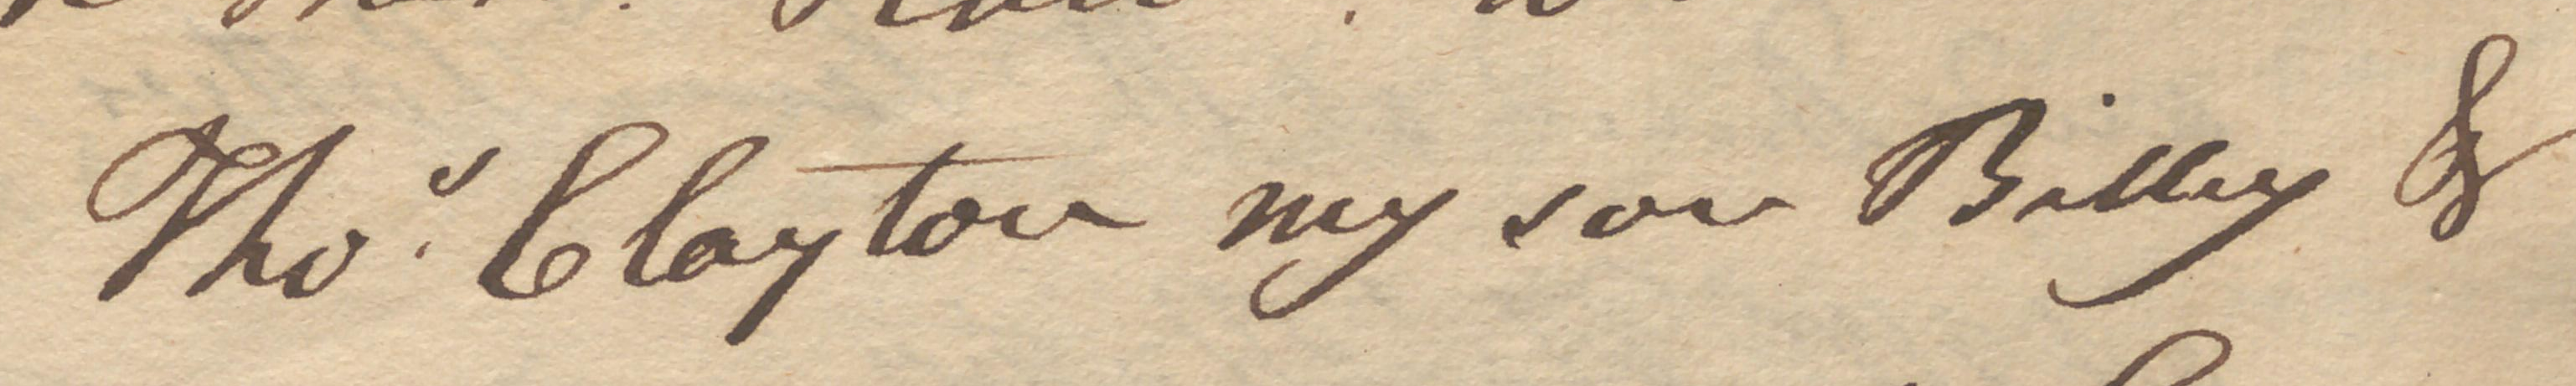Tho^s. Clayton my son Billey &
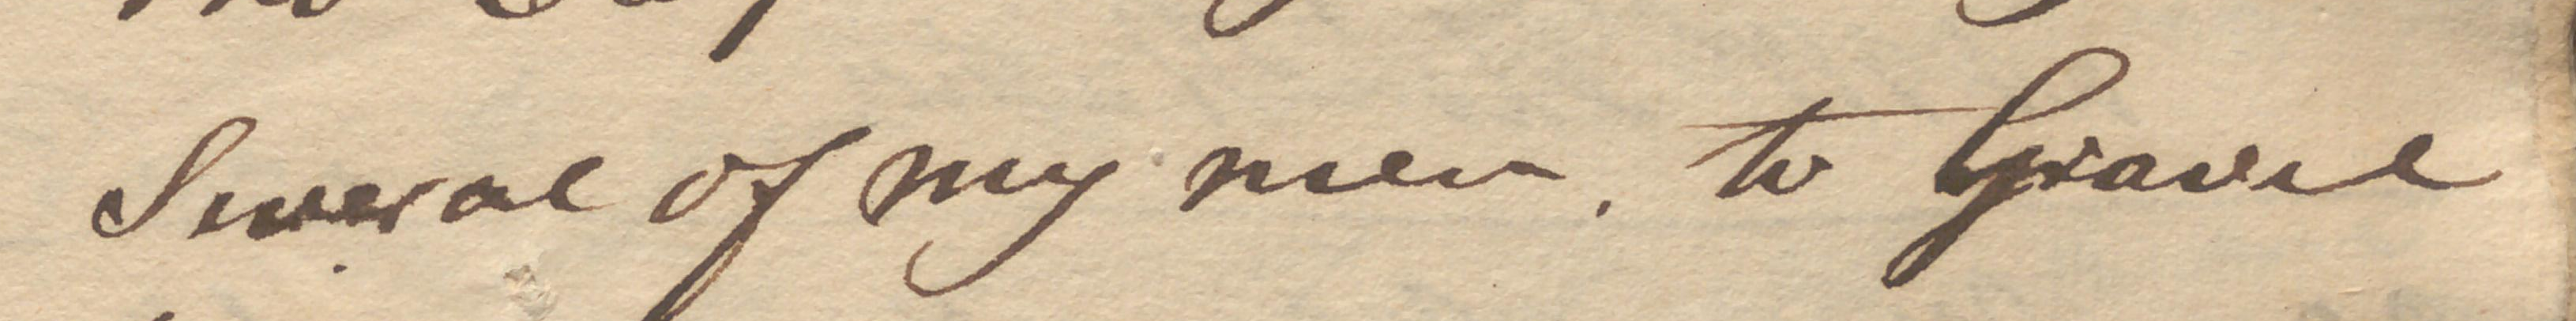several of my men, to Gravel
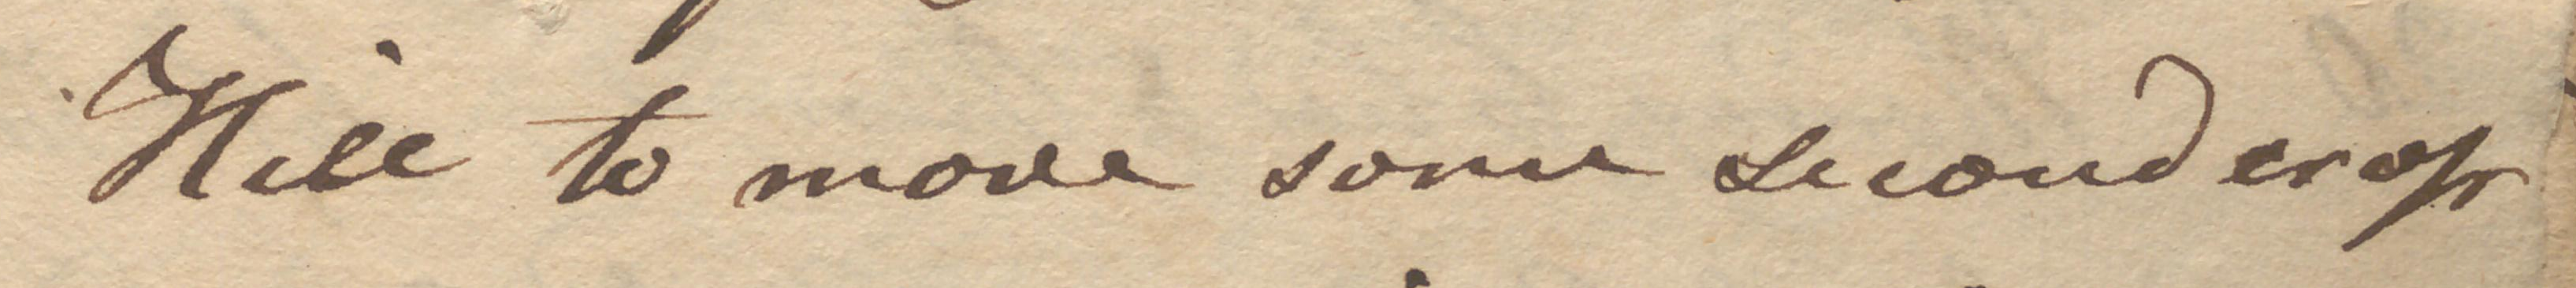Hill to move some second crop
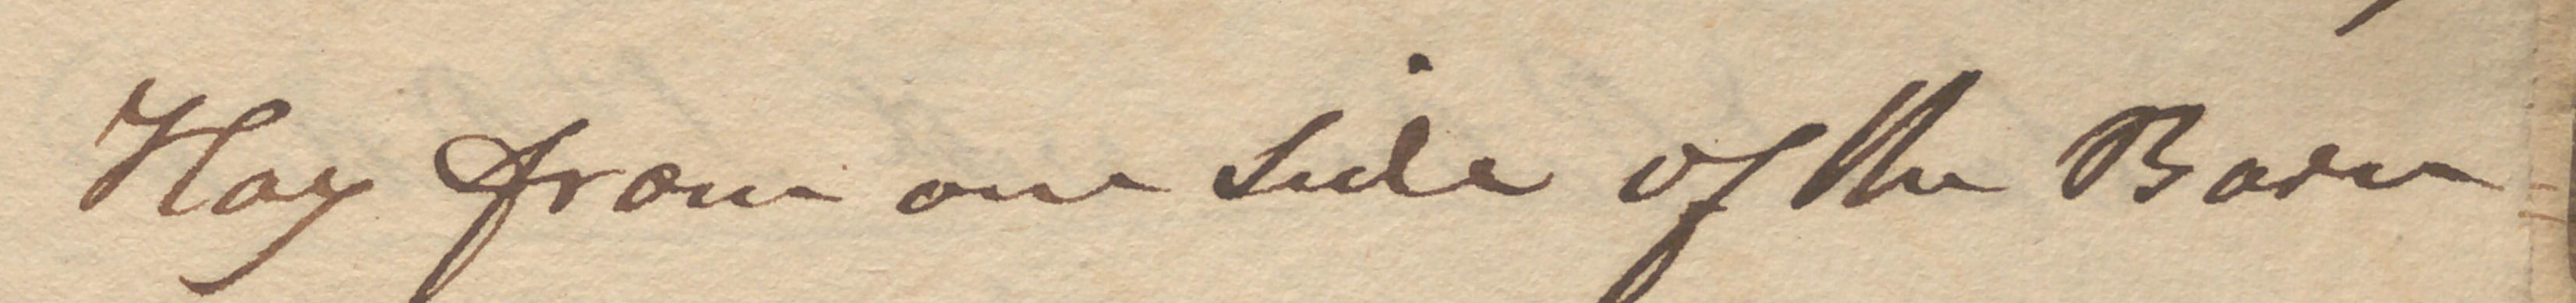Hay from one side of the Barn
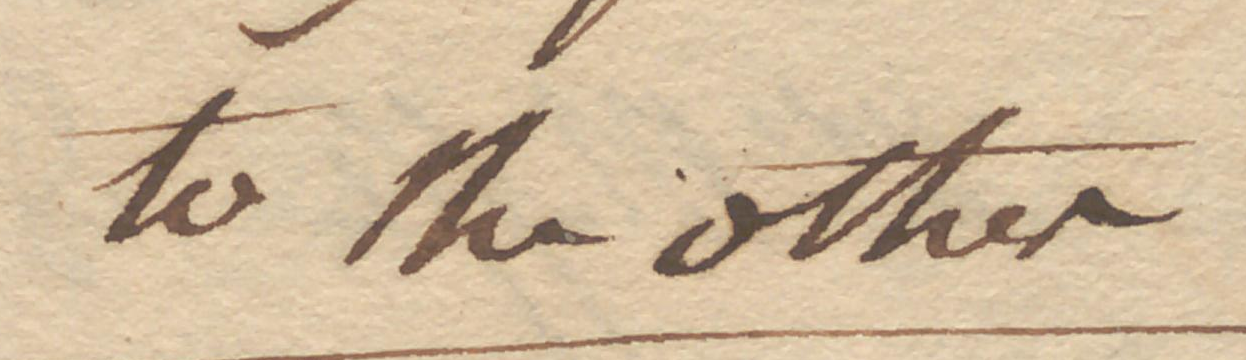to the other
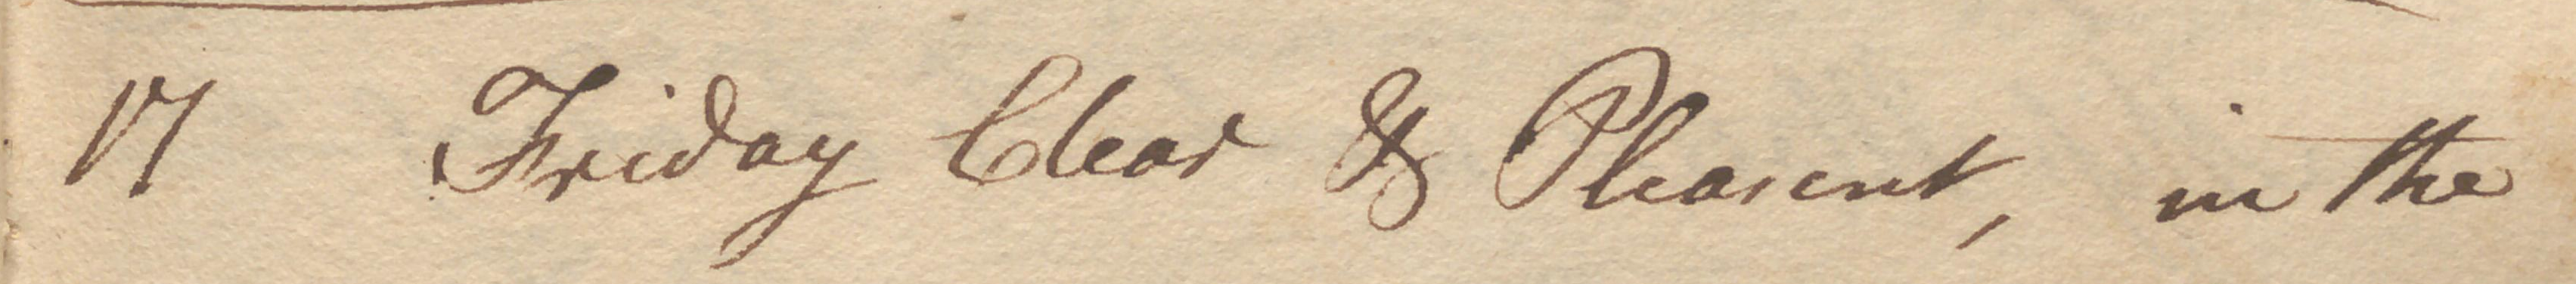17 Friday Clear & Pleasent in the
